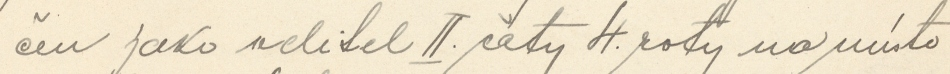čen jako velitel II. čety 4. roty na místo
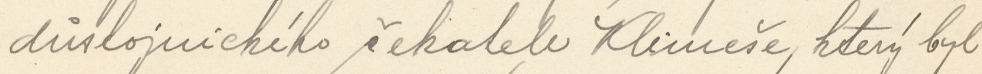důstojnického čekatele Klimeše, který byl
